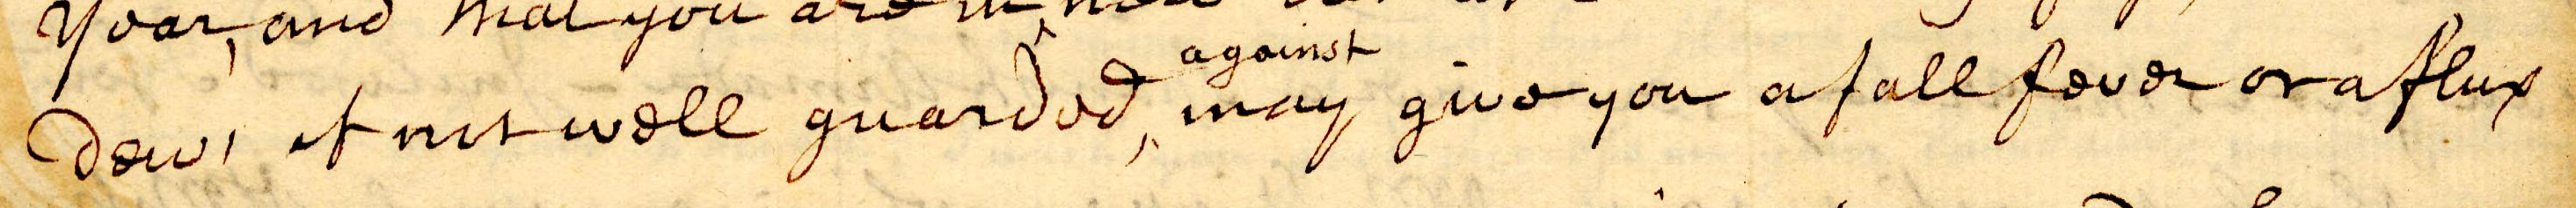dows, if not well guarded, ^ may give you a fall fever or a flux
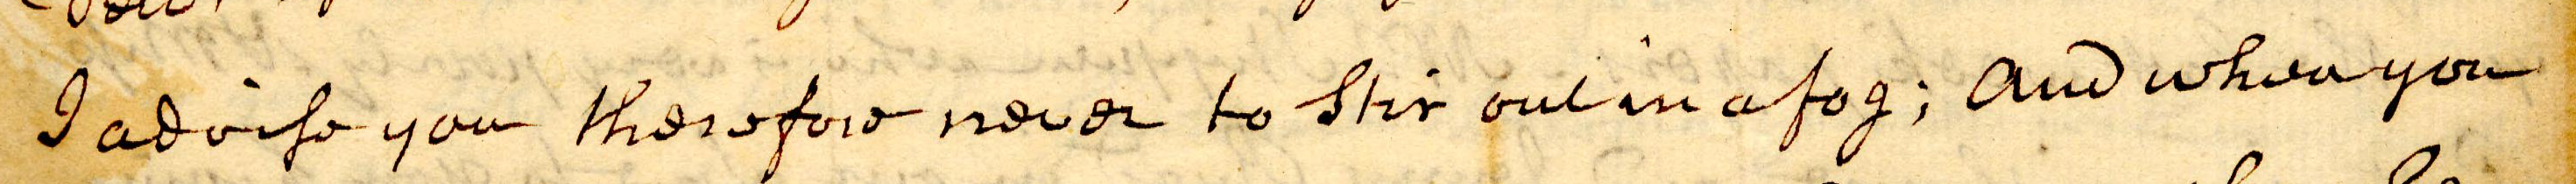I advise you therefore never to sit out in a fog; and when you
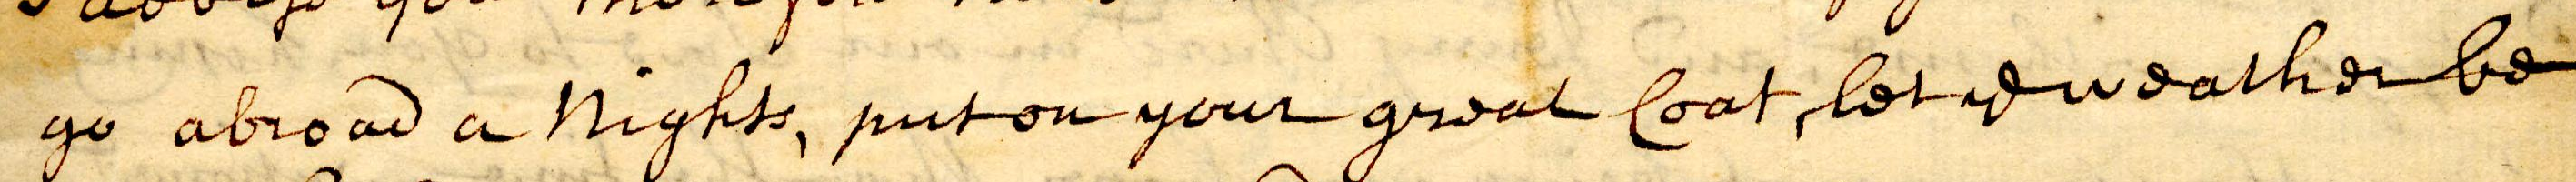go abroad a Nights, put on your great Coat, let y^e weather be
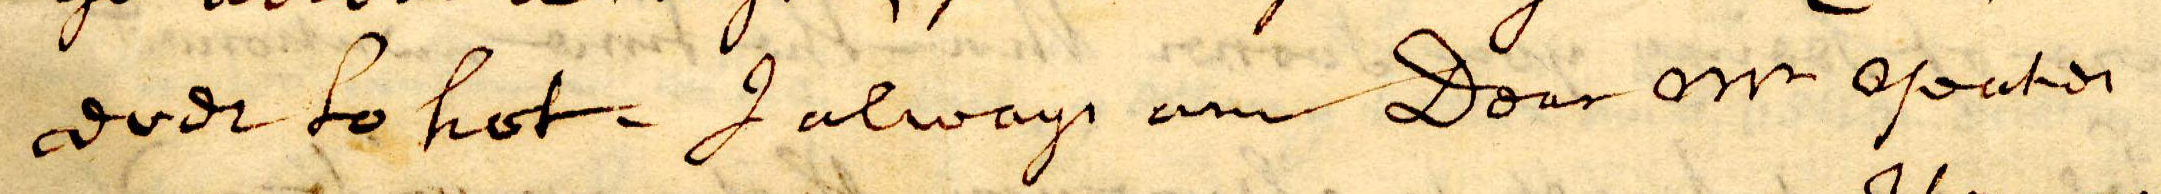ever so hot- I always am Dear M^r Yeates
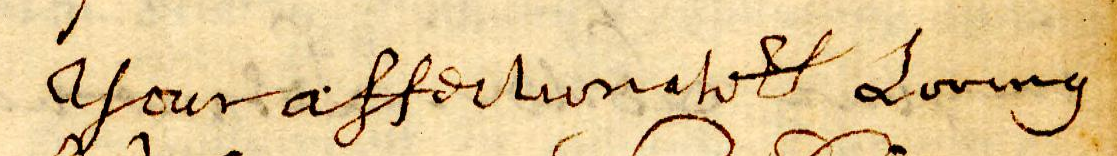your affectionate & Loving
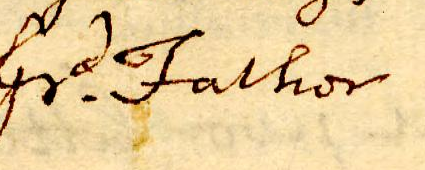G^d. Father
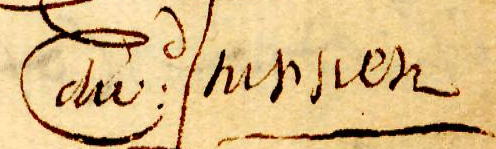Edw: Shippen
